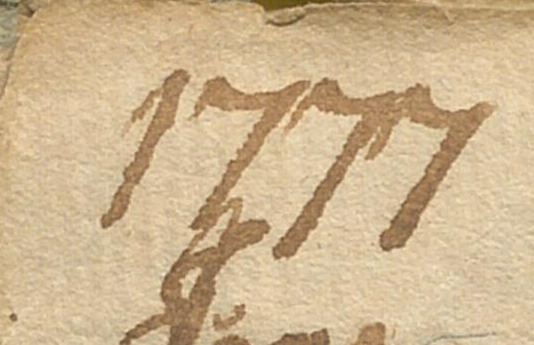1777
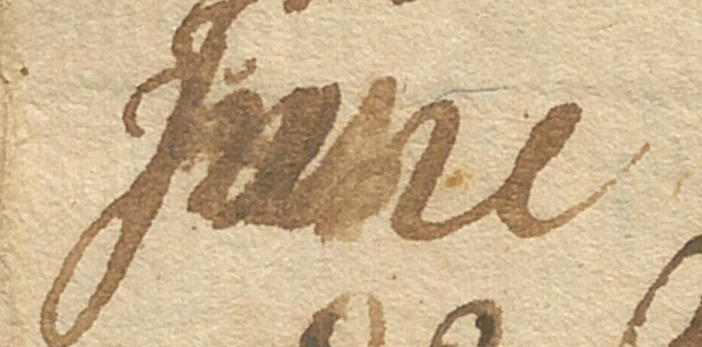June
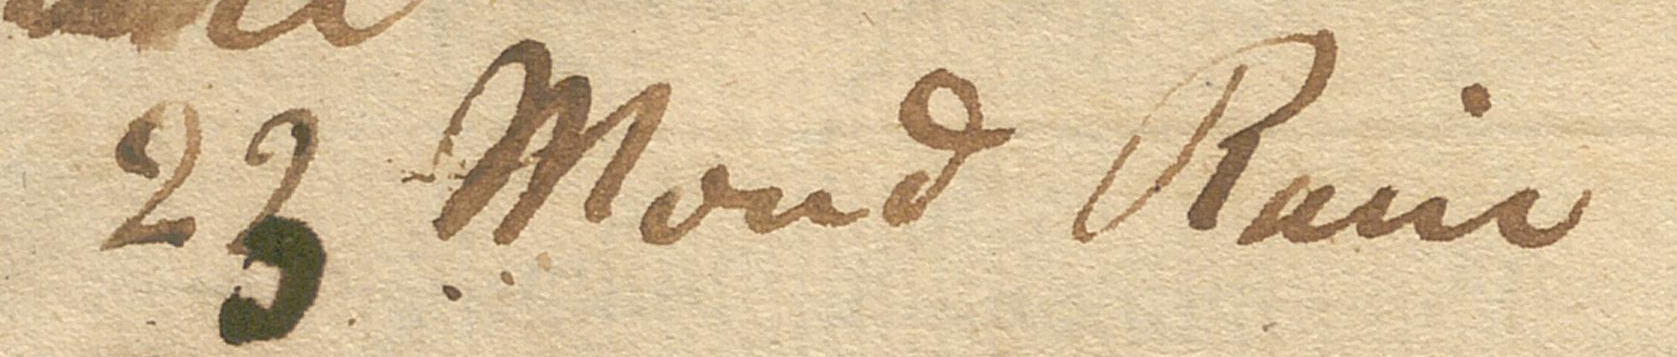23 Mond Rain
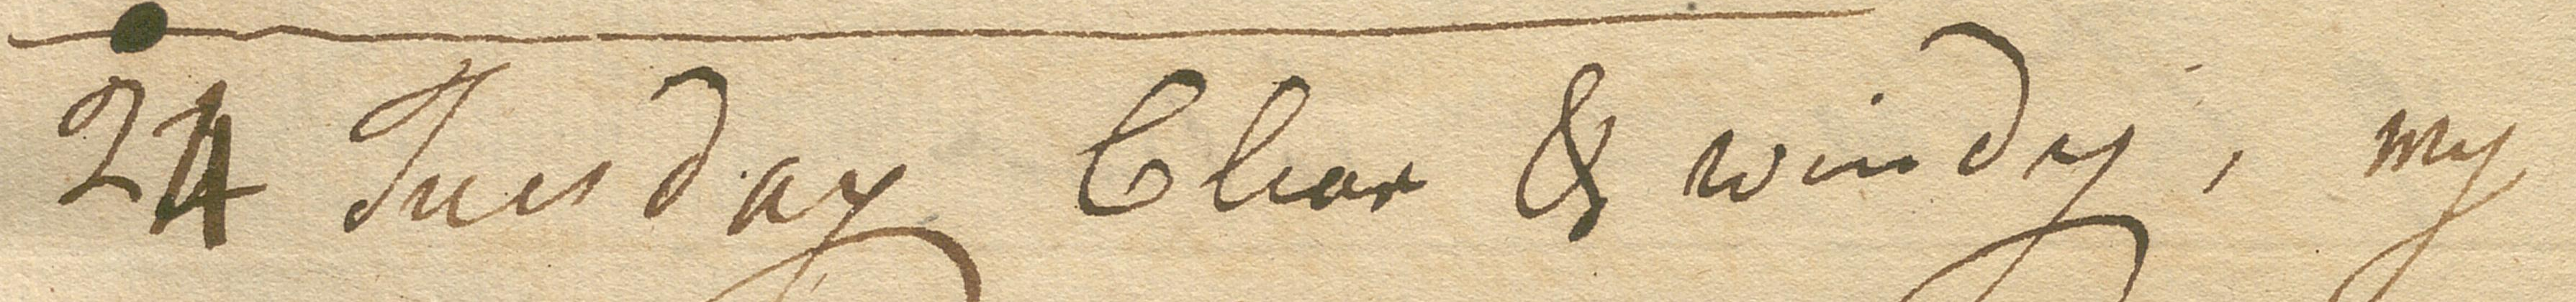24 Tuesday, Clear & windy, my
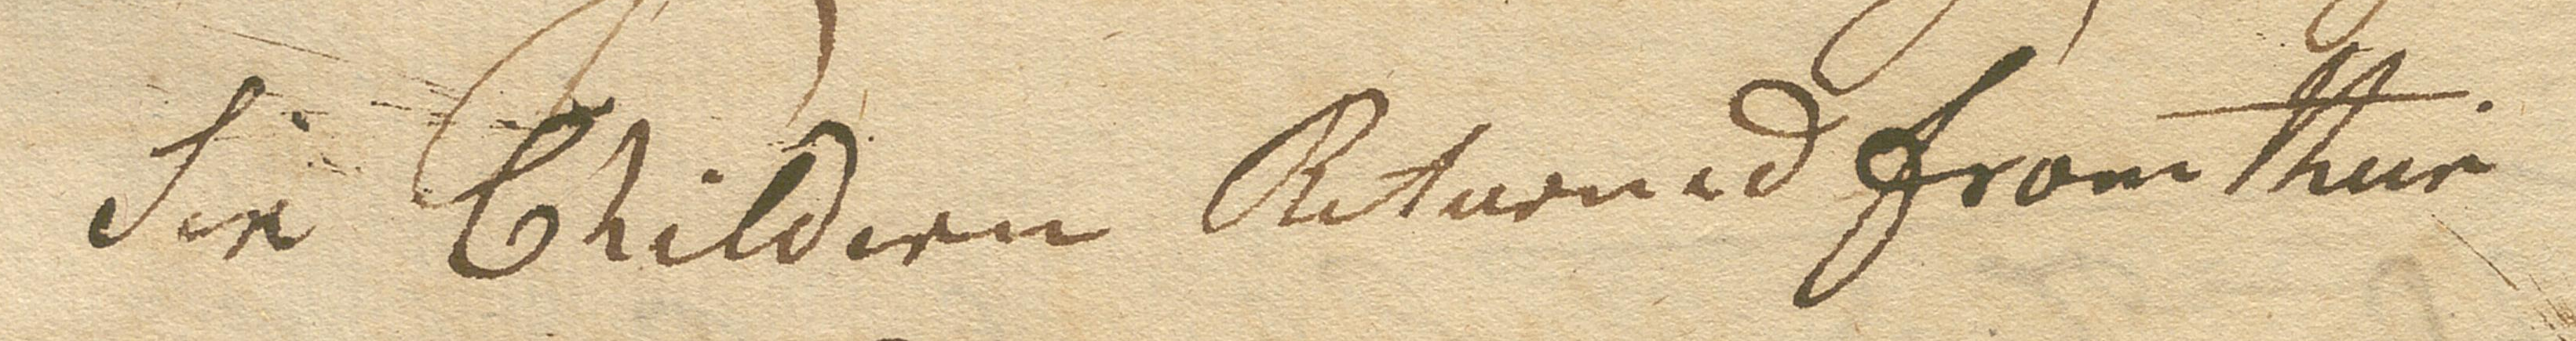Six Childern Returned from their
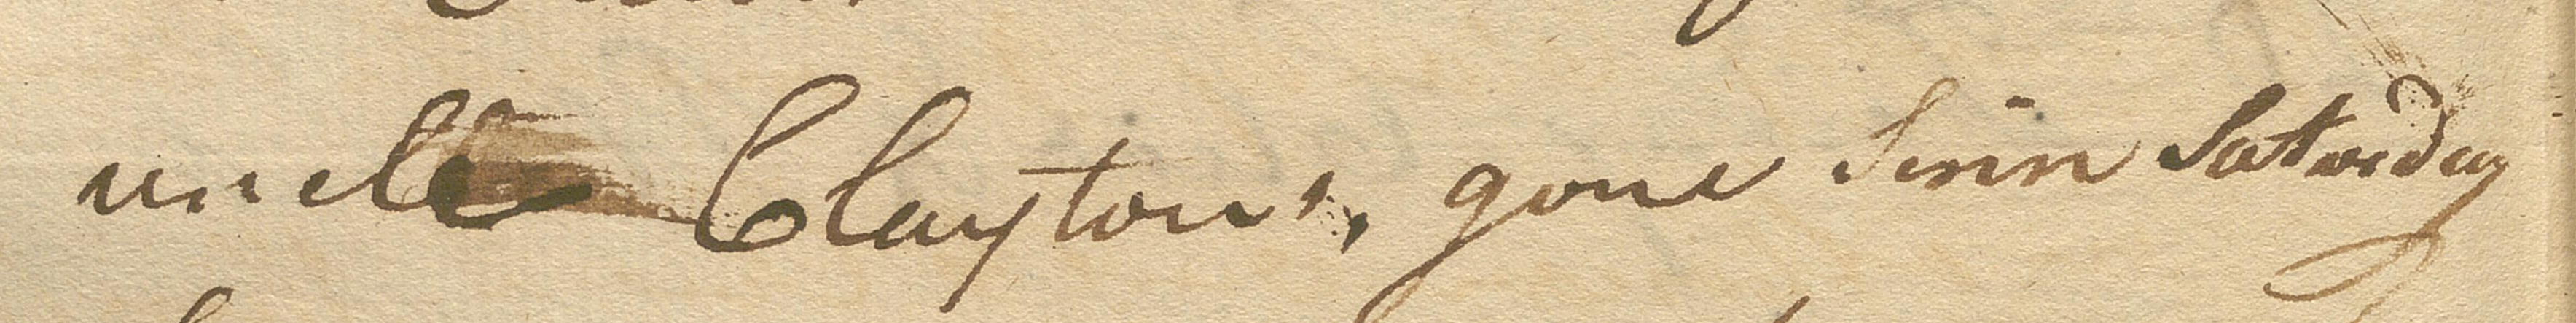uncle Claytons, gone sinn Saturday
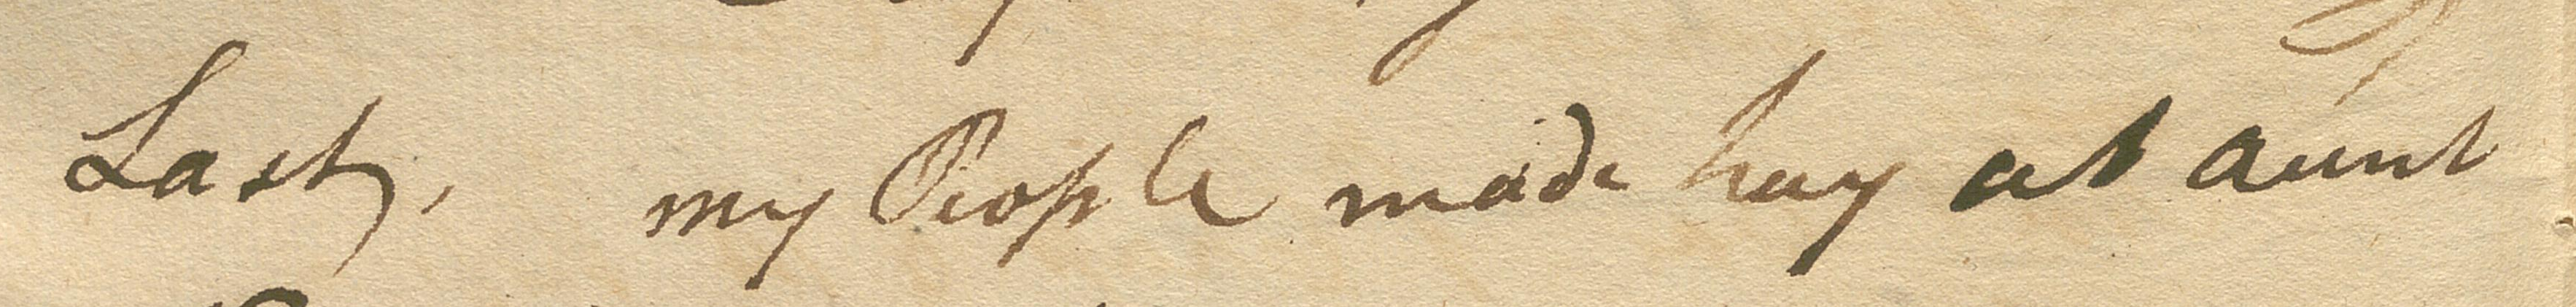Last, my People made hay at aunt
